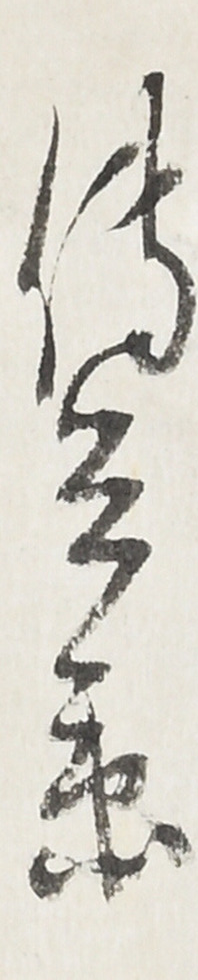伝兵衛
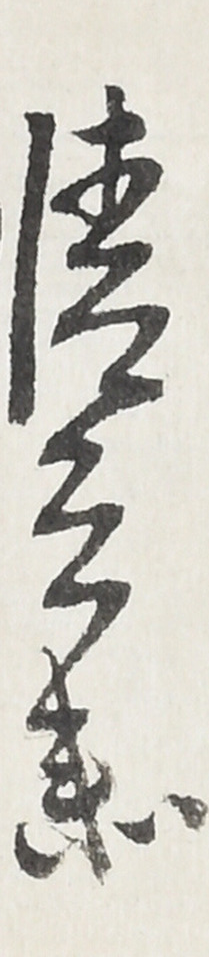清兵衛
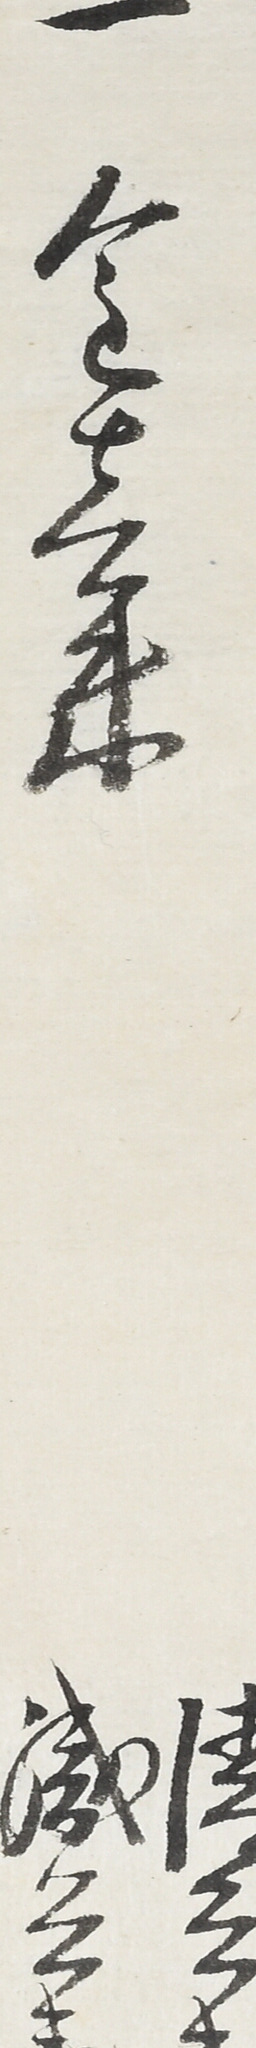一金壱朱孫兵衛
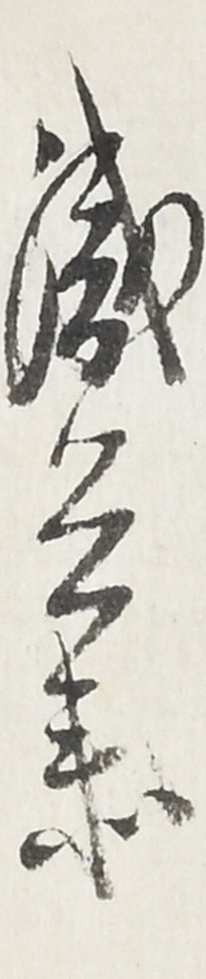治兵衛
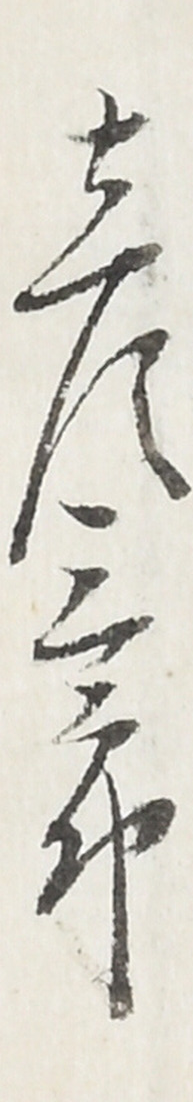彦三郎

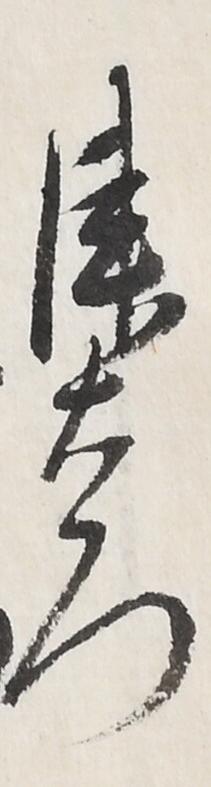津右衛門
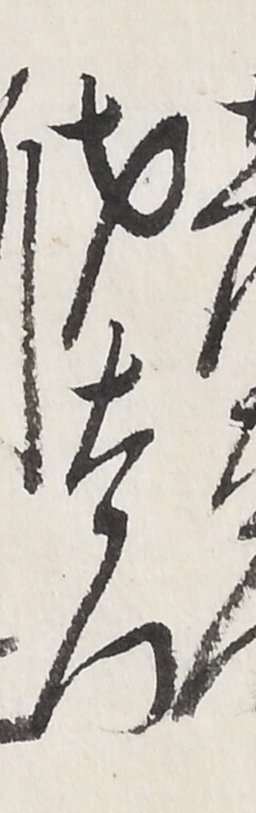津右衛門
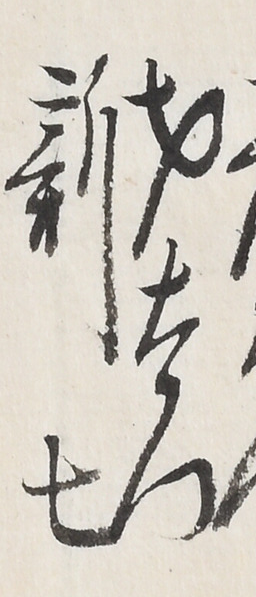津右衛門
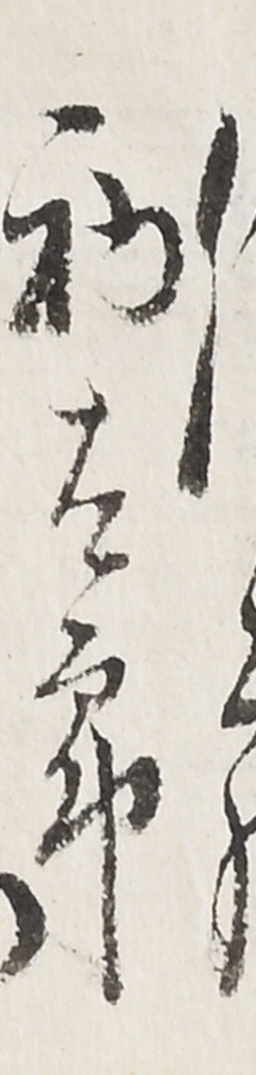初太郎
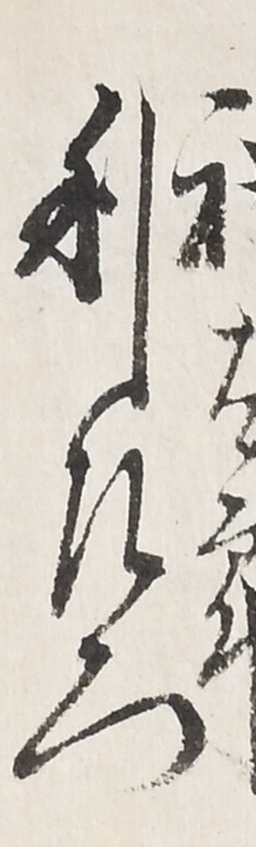利左衛門
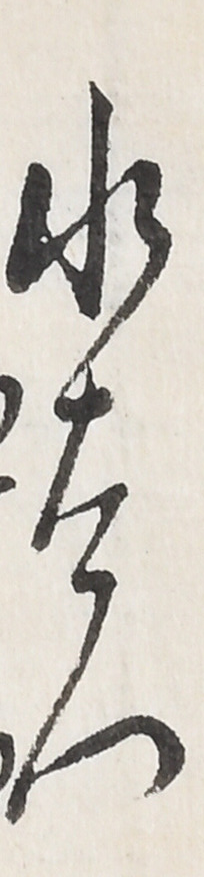水右衛門
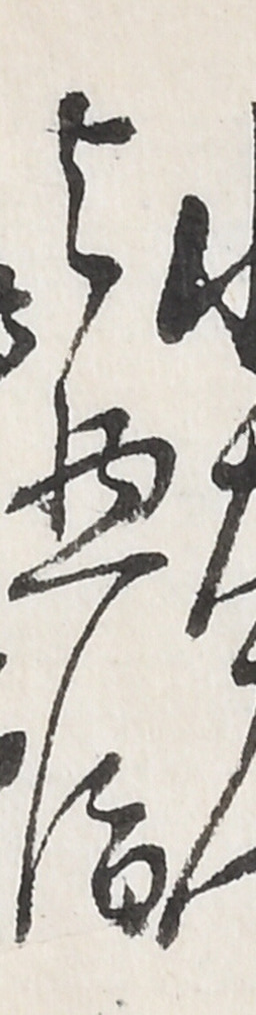与惣治
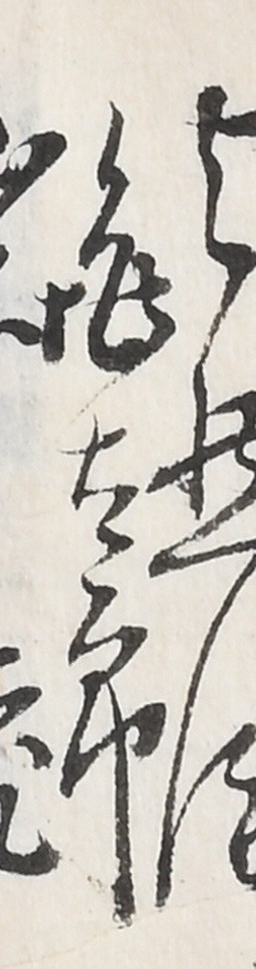初太郎
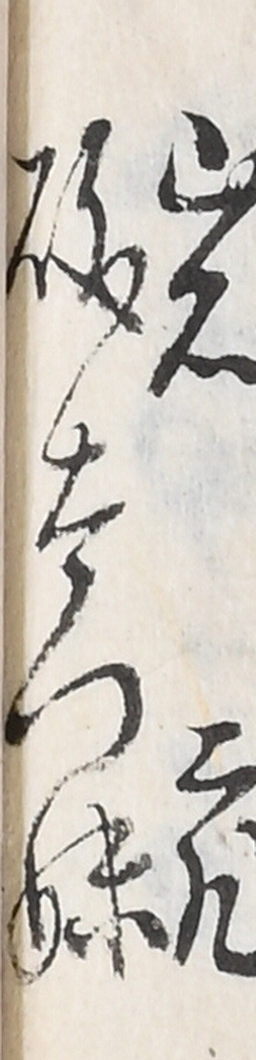磯右衛門妹
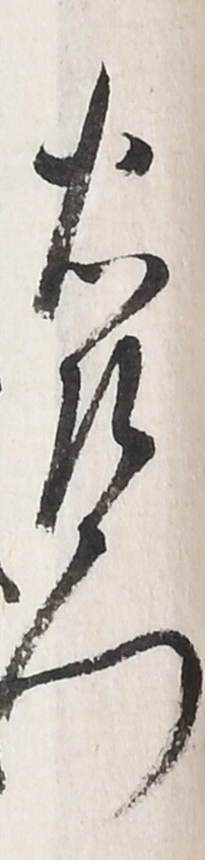利左衛門
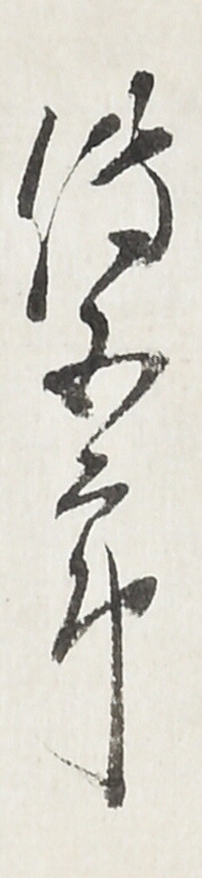伝五郎
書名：御拝地百五拾年御祝儀献上御目録名前
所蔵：伊那市立高遠町図書館・合同会社AMANE
